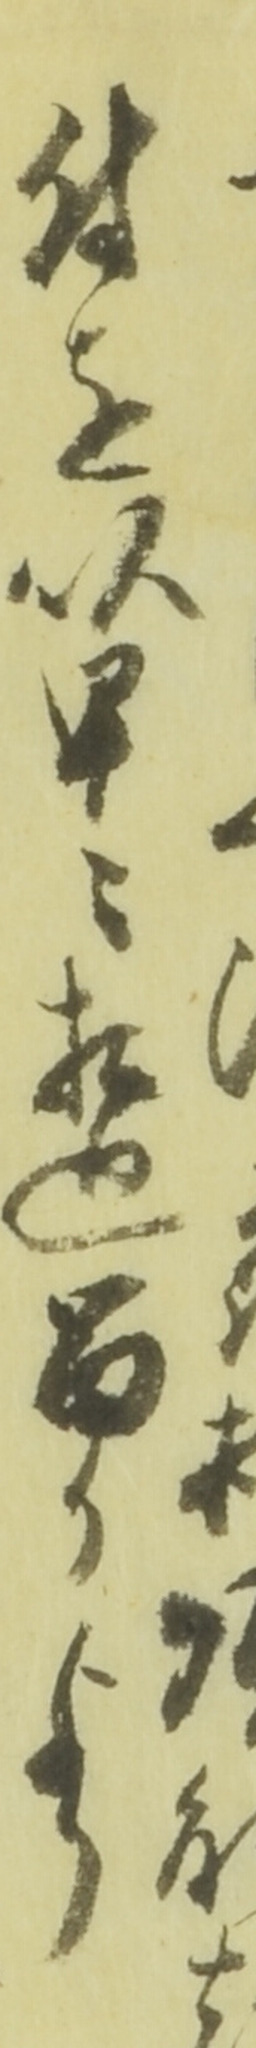付を以早々相廻留りより
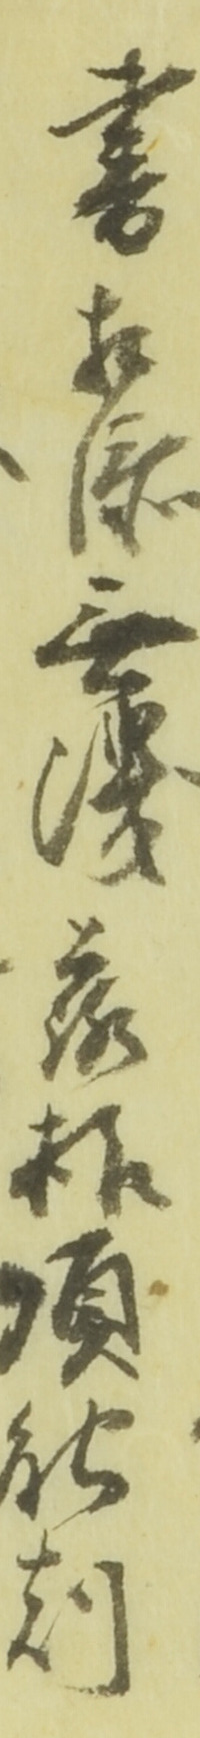書相添無洩落様頂能刻
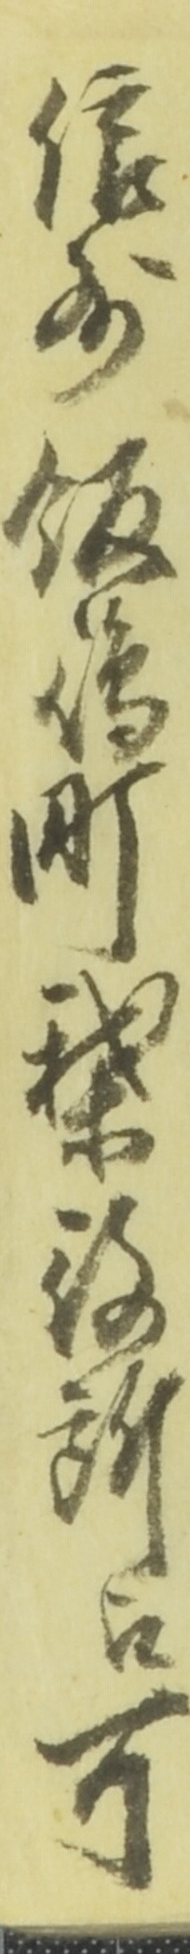信州飯嶋町我等役所江可

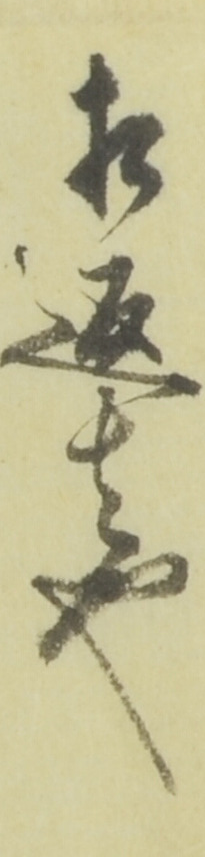相返者也
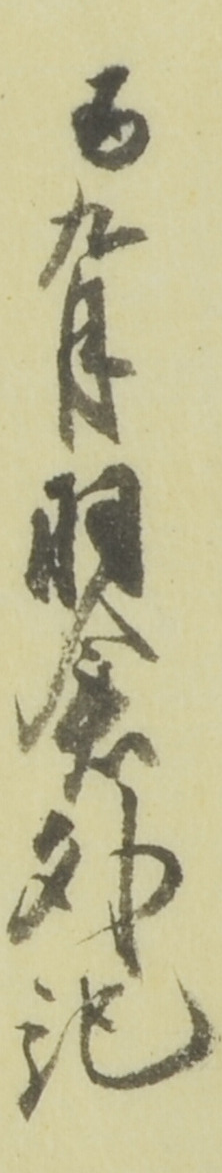酉九月羽倉外記
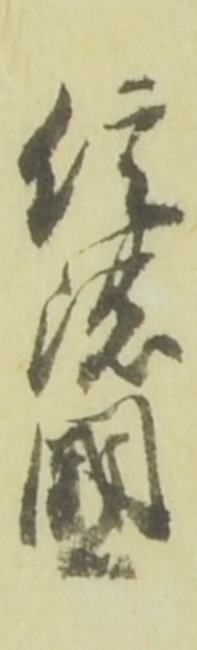信濃国
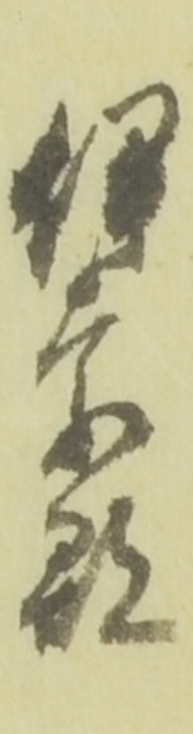伊那郡
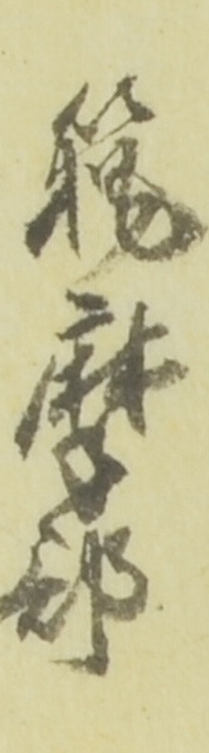筑摩郡
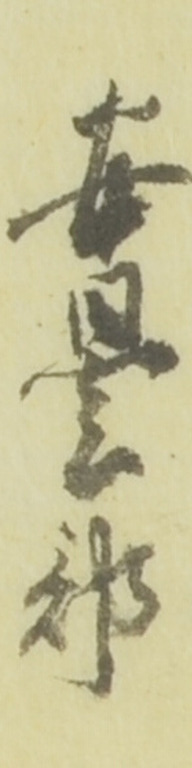安曇郡
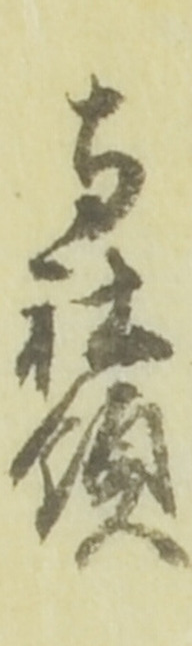寺社領
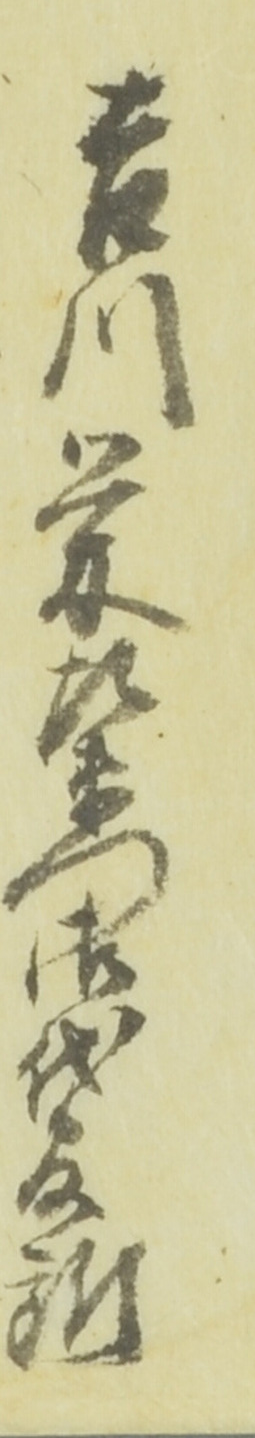吉川栄左衛門御代官所
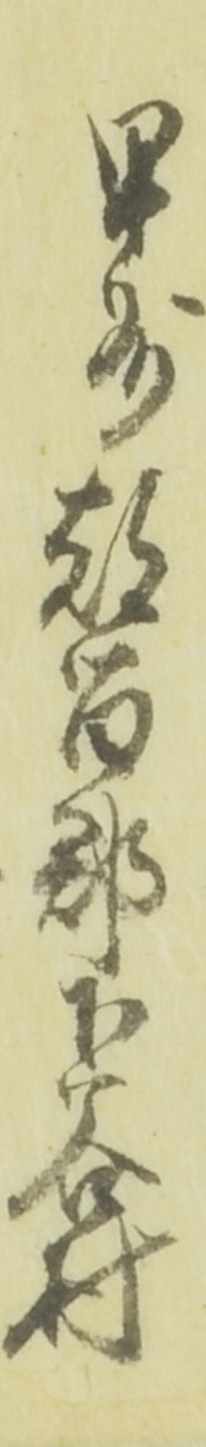甲州都留郡下谷村
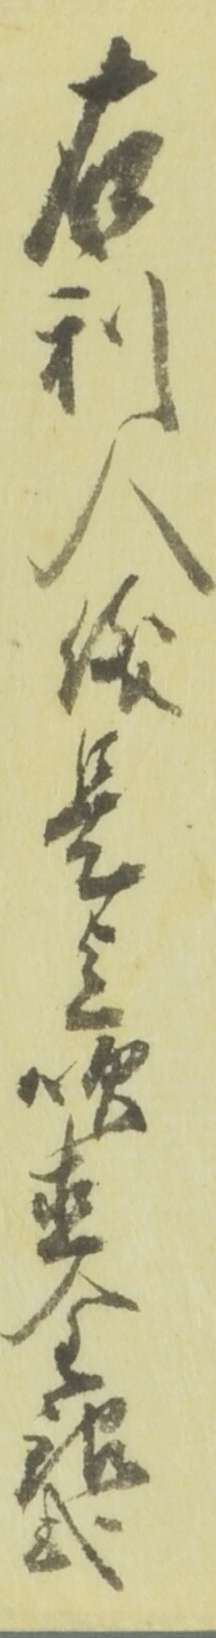右利八儀是迄吹直金銀弐
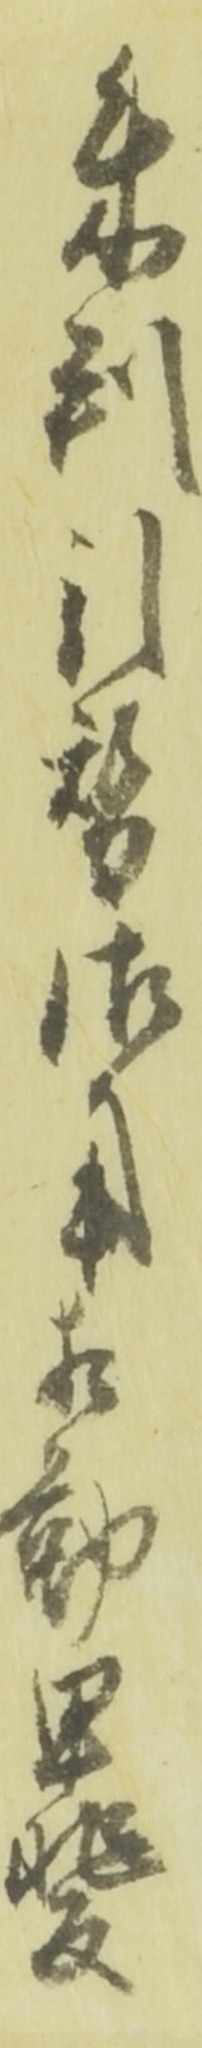朱判引替御用相勤甲斐
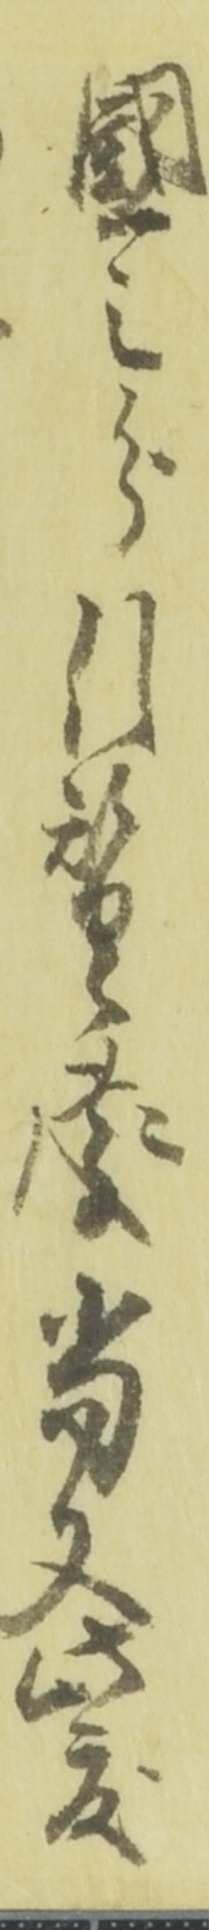国之分引替候処尚又此度
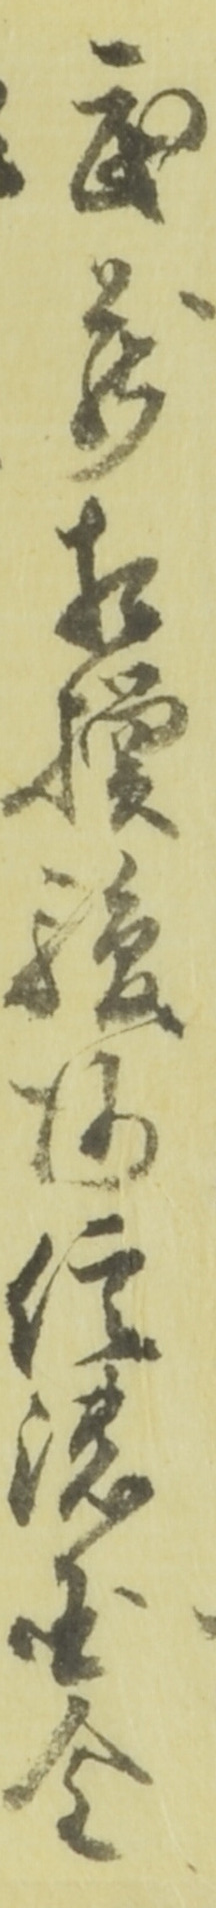武蔵相模駿河信濃国金
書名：御触書御書附控
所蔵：伊那市立高遠町図書館・合同会社AMANE
